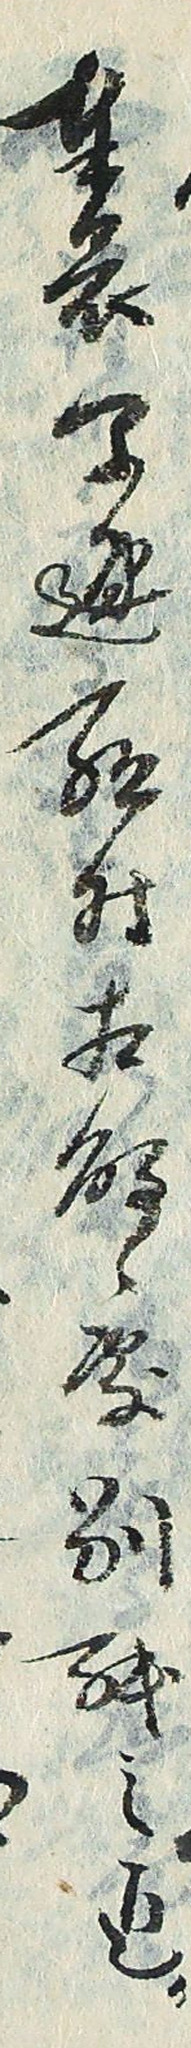奉畏早速組村相触候処別紙之通り
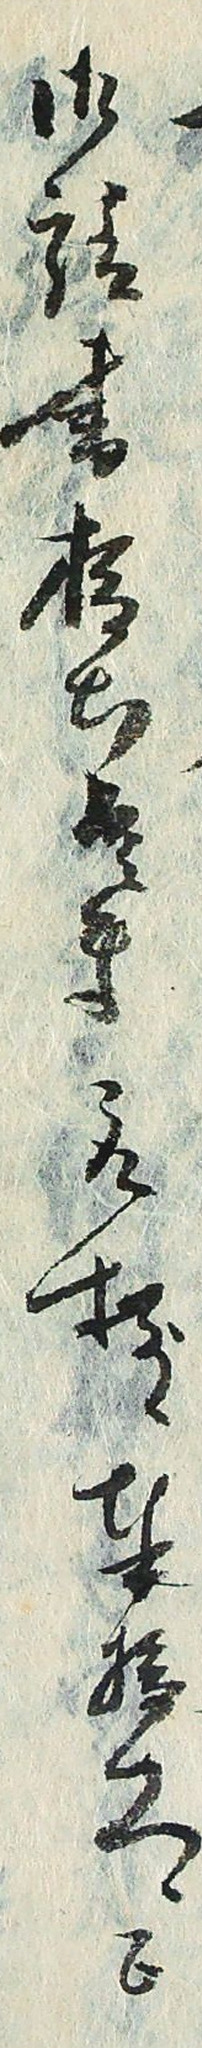御請書指出候に付取揃へ奉指上候以上
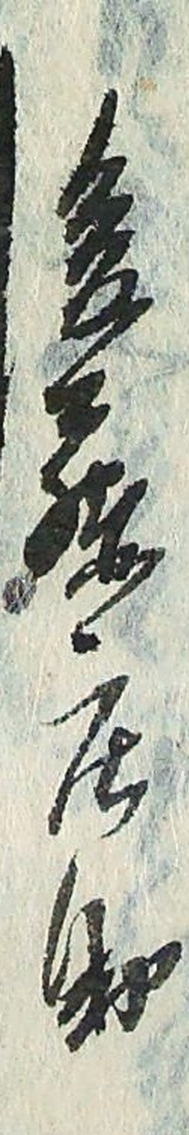後藤庄助
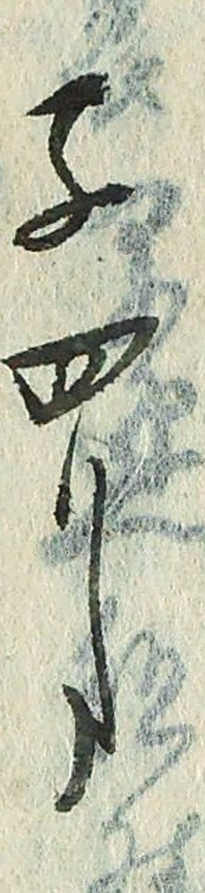子四月
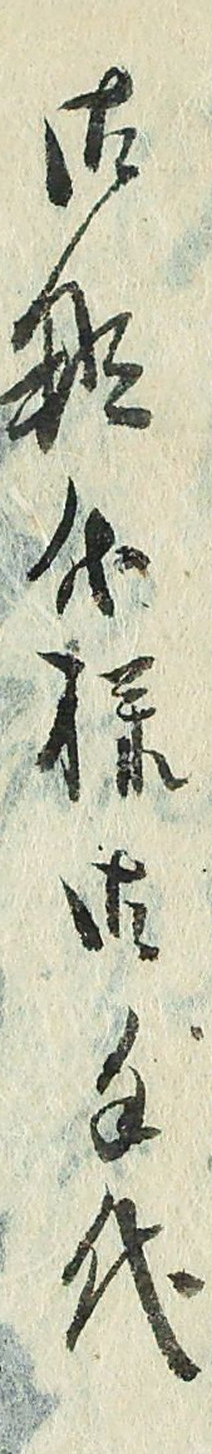御郡代様御手代
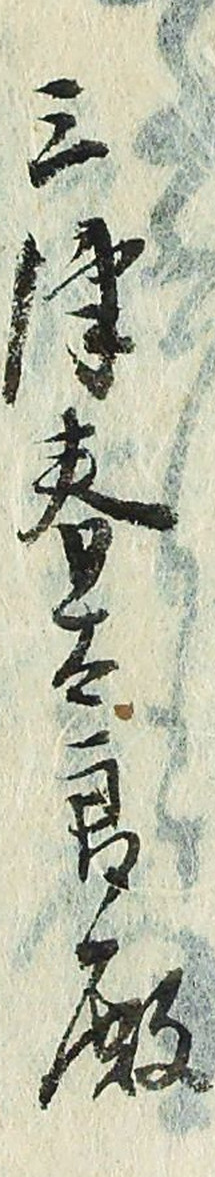三沢春太郎殿
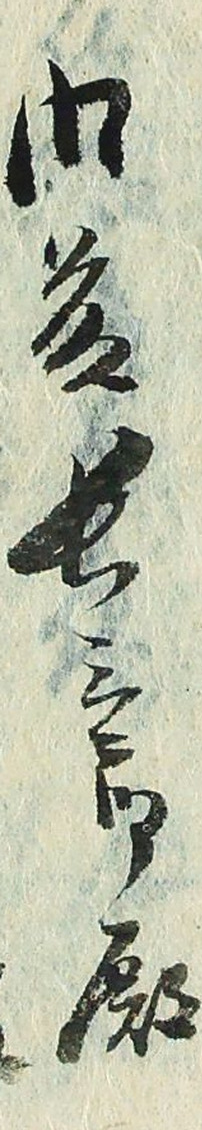内藤長三郎殿
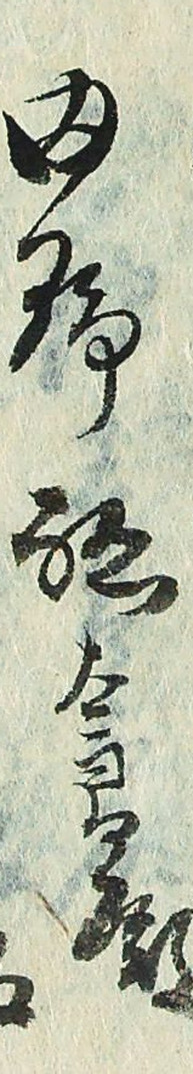田野祐太郎殿
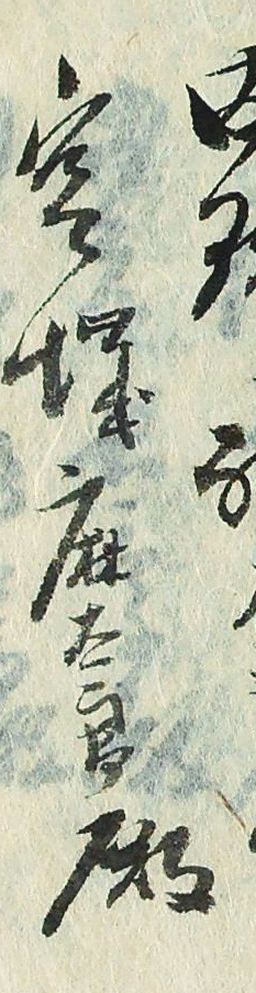宮城麻太郎殿

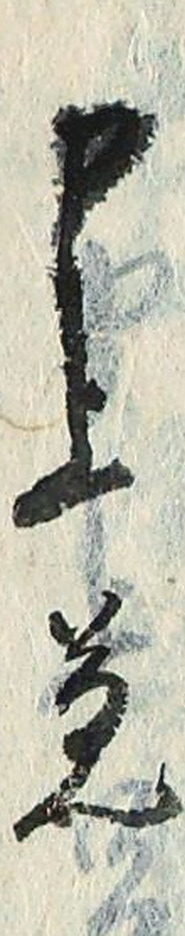申上覚
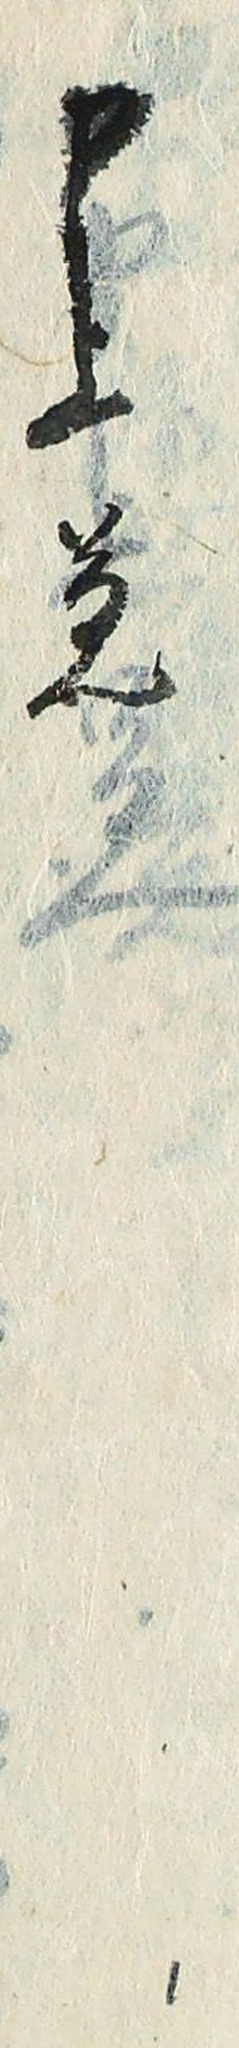申上覚
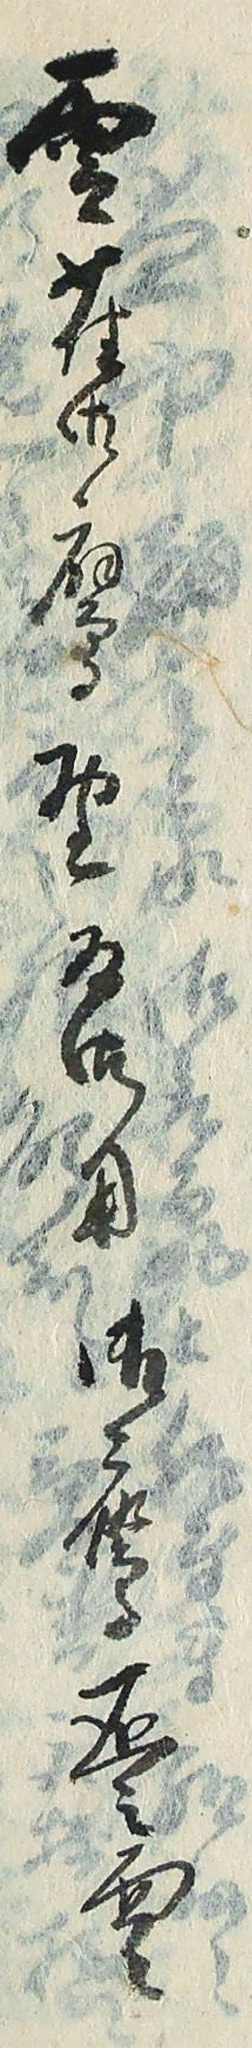雲雀御鷹野為御用御鷹匠之面々
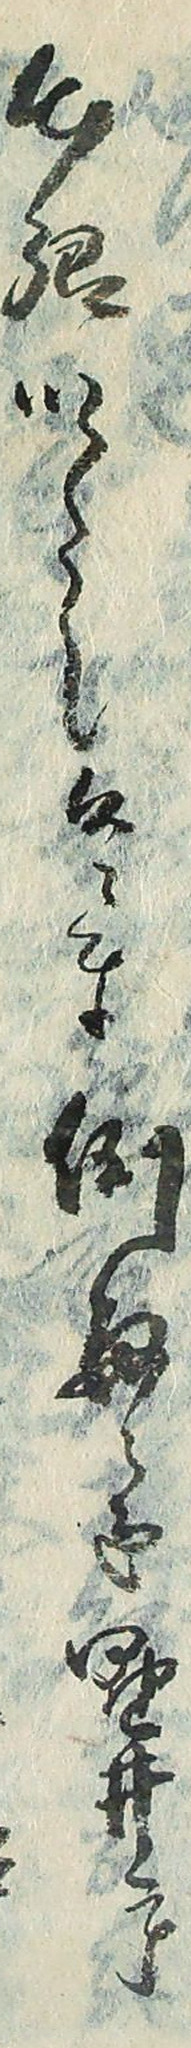出郷いたし候に付例毎之通野井戸
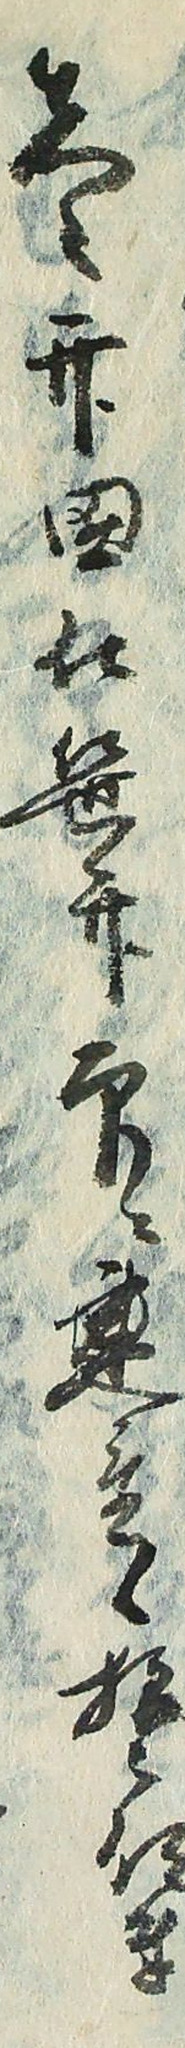夫々竹囲仕笹竹印に建置候様被仰付
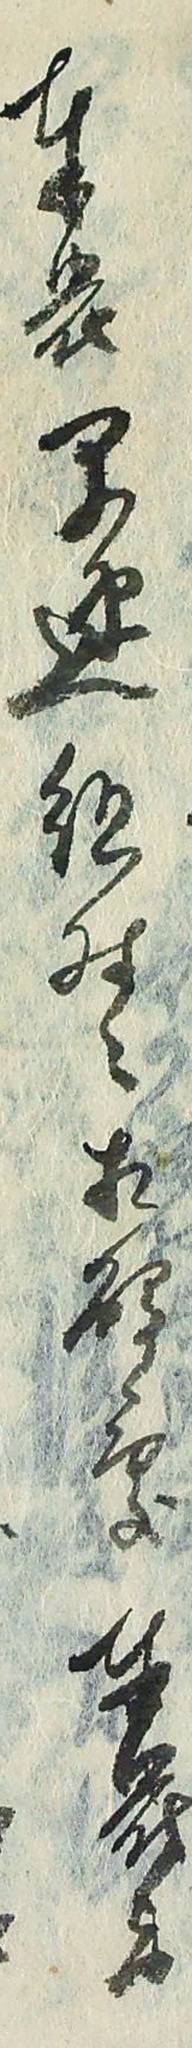奉畏早速組村々相触候処奉畏旨
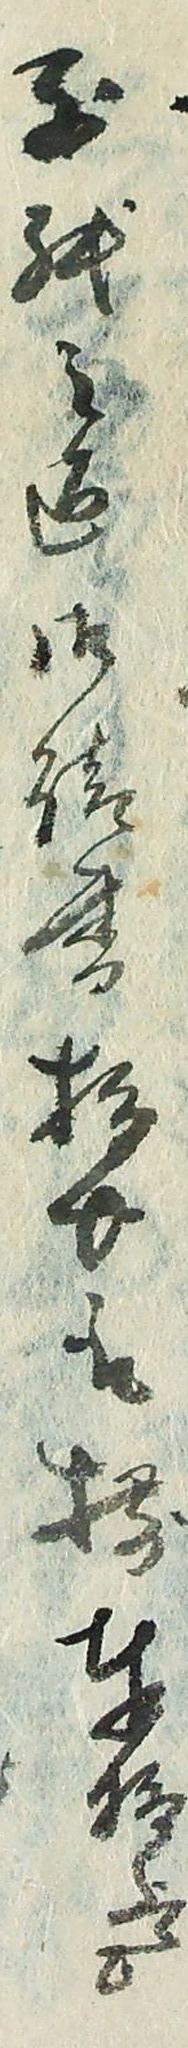別紙之通御請書指出取揃奉指上候以上
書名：諸御用御□受書控
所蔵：鳴門教育大学 Naruto University of Education
